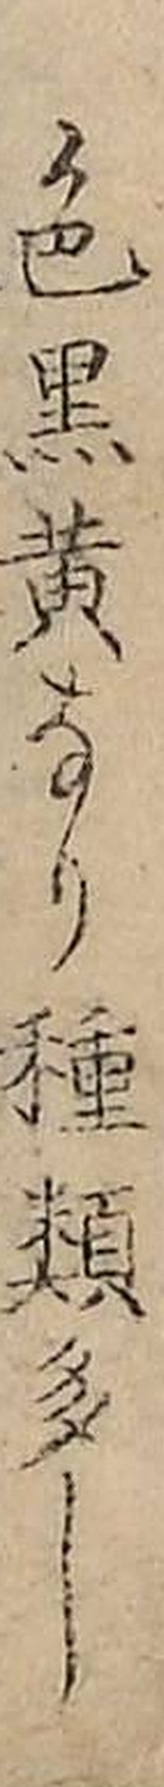色黒黄なり種類多し
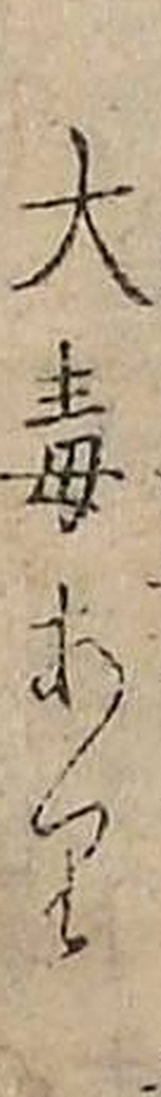大毒あり

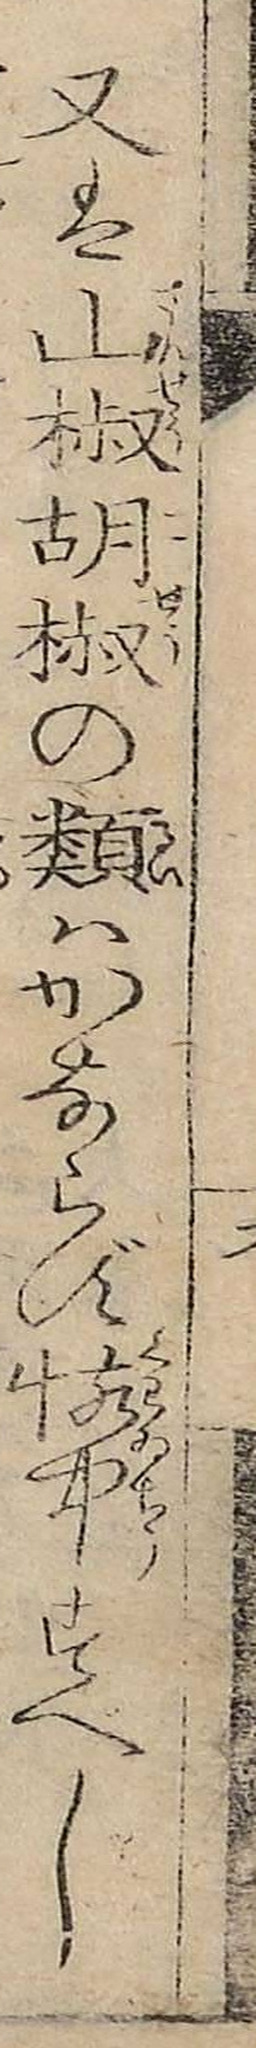又は山椒胡椒の類はかならず懐中すべし
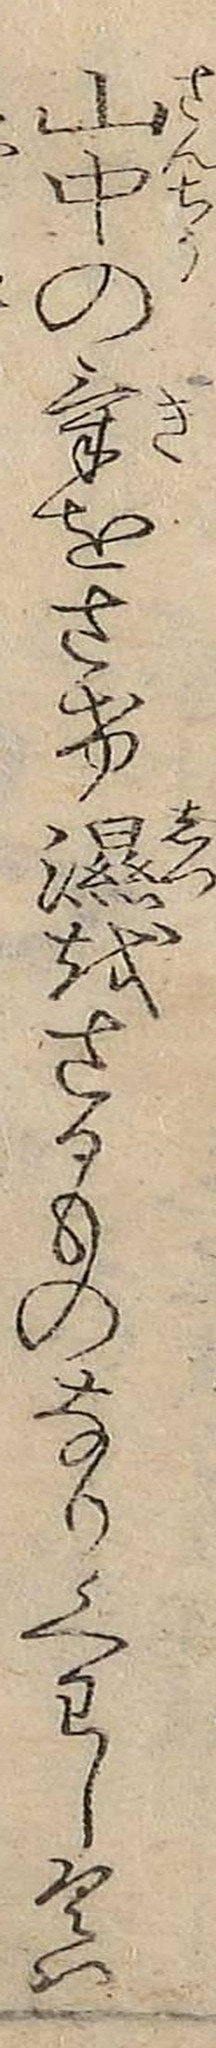山中の気をさけ湿をさるものなりくわしくは
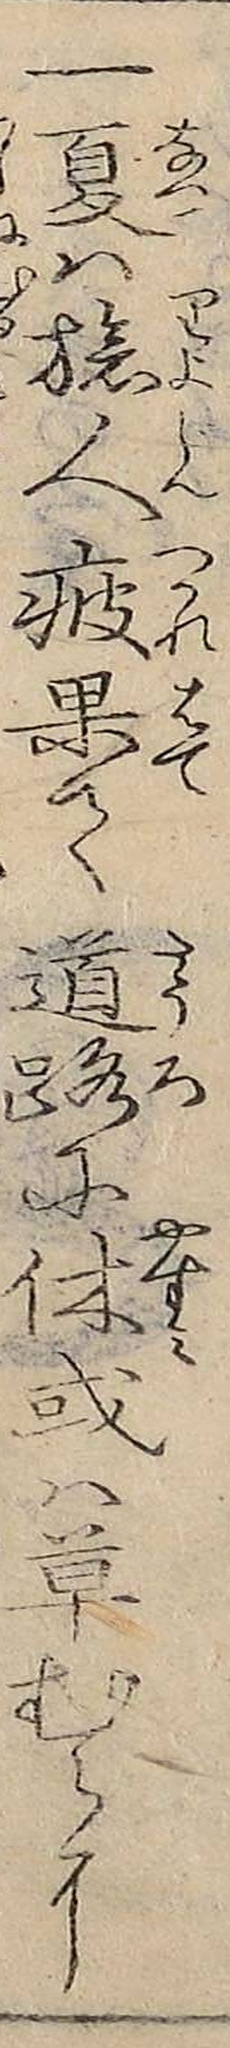一夏は旅人疲果て道路に休或は草むらに
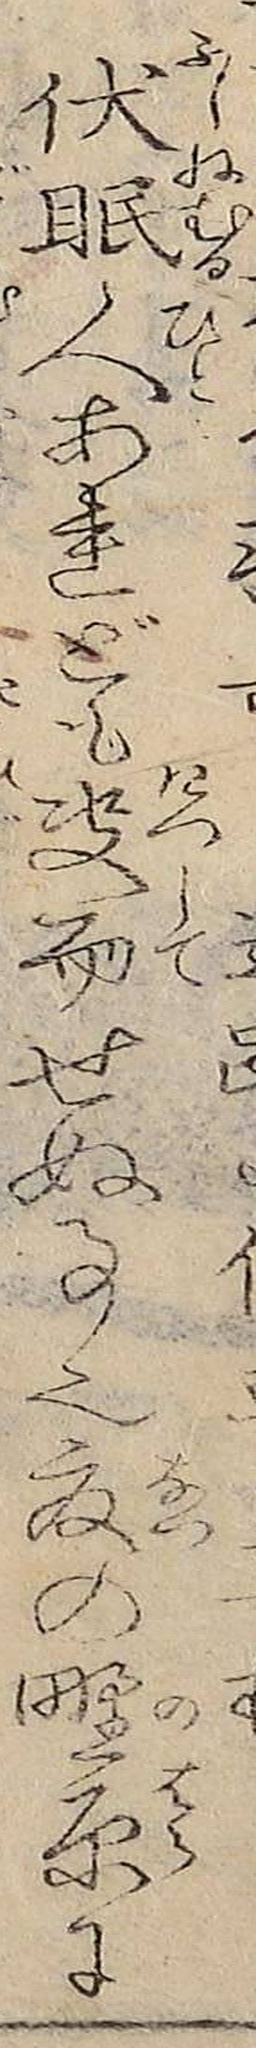伏眠人あれども決而せぬ事也夏の野原に
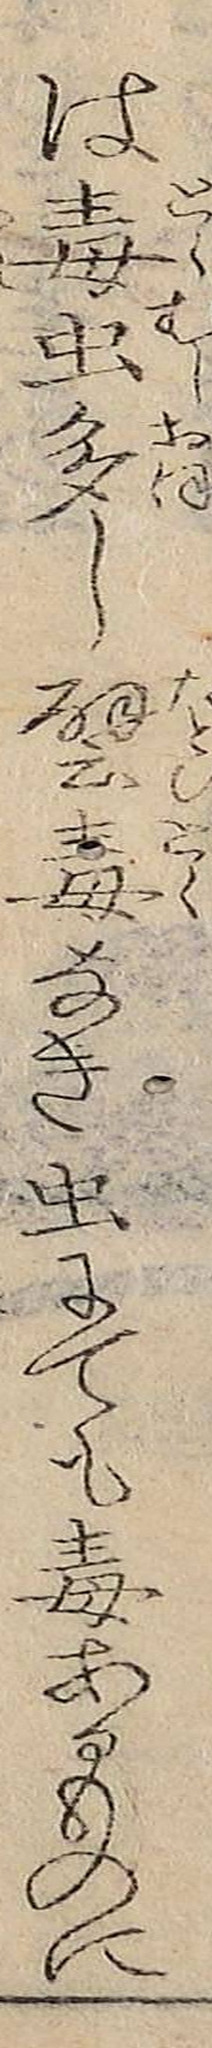は毒虫多し譬毒なき虫にても毒あるものに
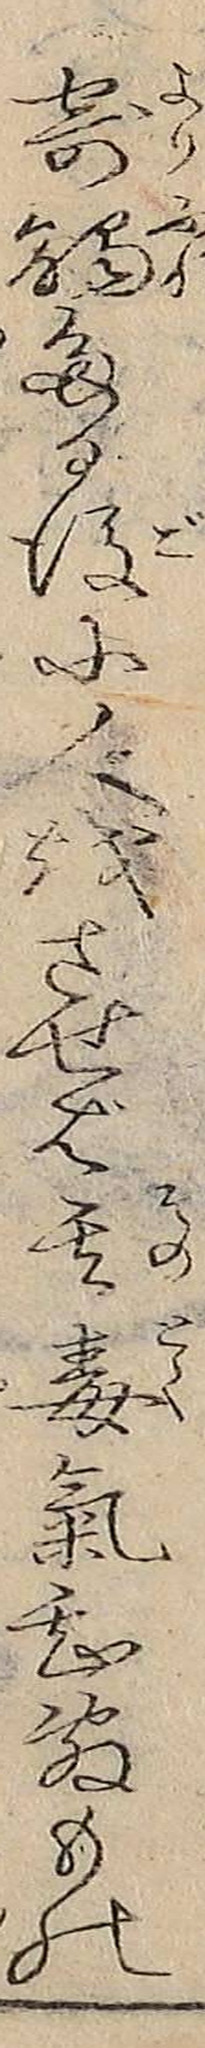寄触たる後に人をさせば其毒気甚敷もの
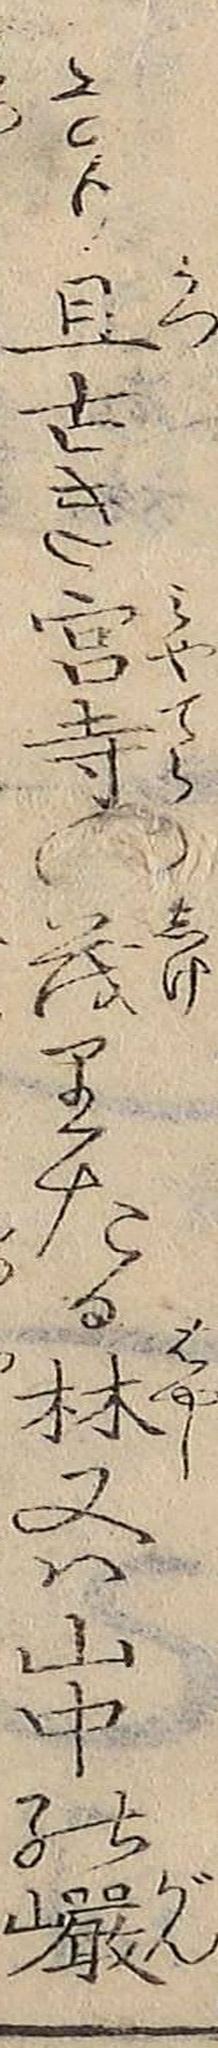なり且古き宮寺の茂りたる林又は山中の巌
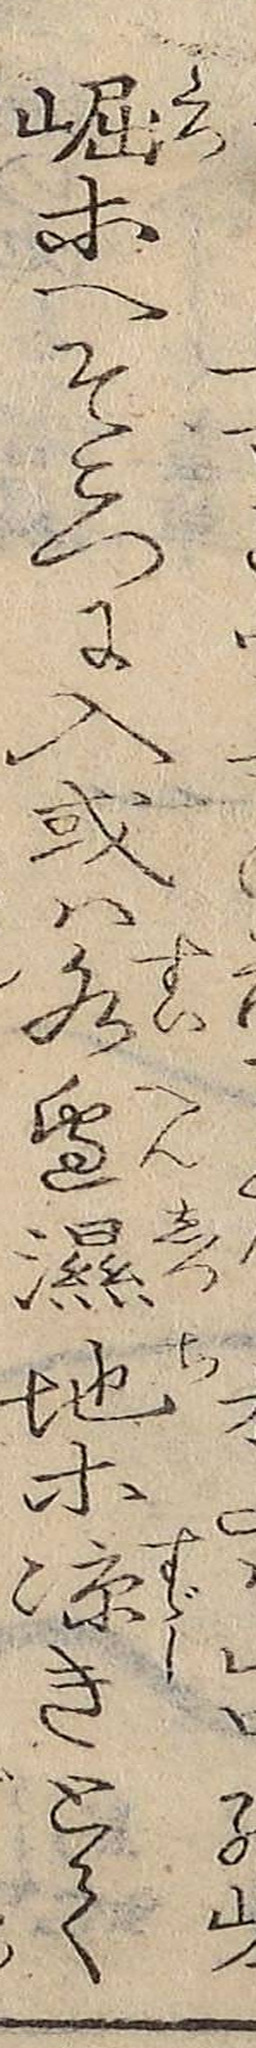崛等へそこつに入或は水辺湿地等涼きとて
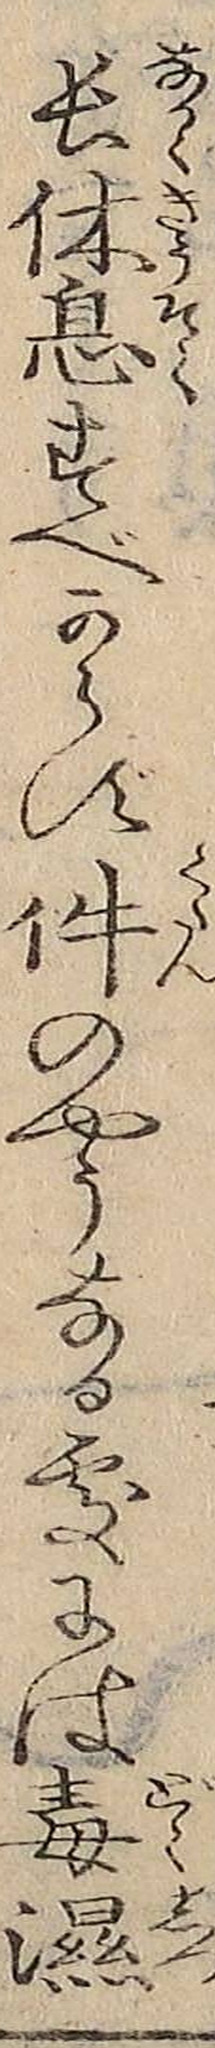長休息すべからず件のやうなる処には毒湿
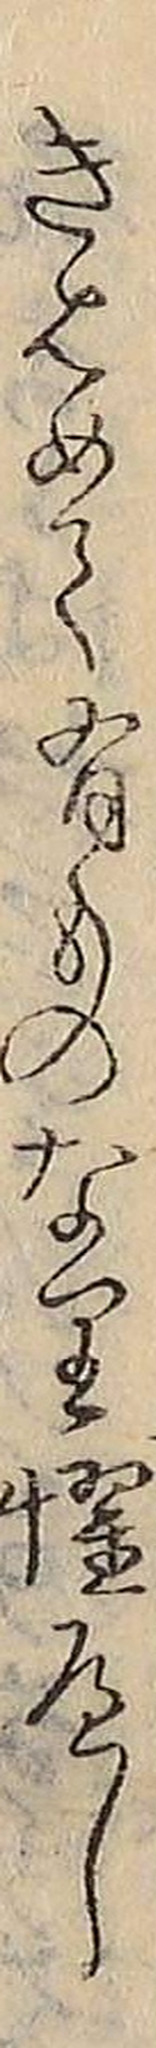きはめて有ものなり懼へし
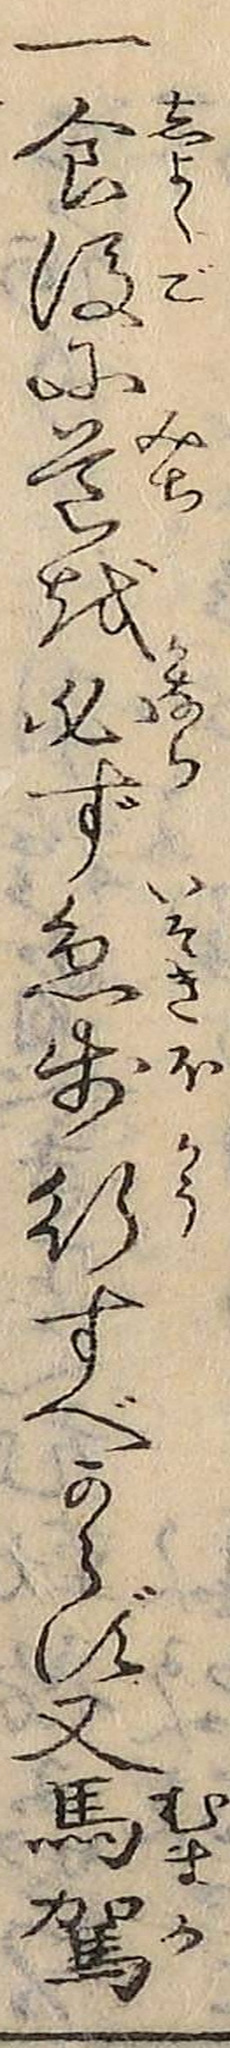一食後に道を必ず急歩行すべからず又馬駕
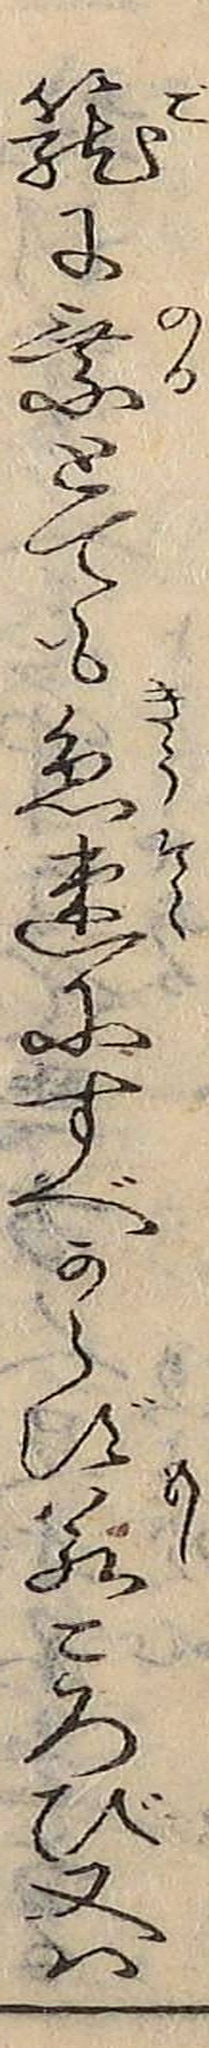籠に乗とても急速にすべからず若ころび又は
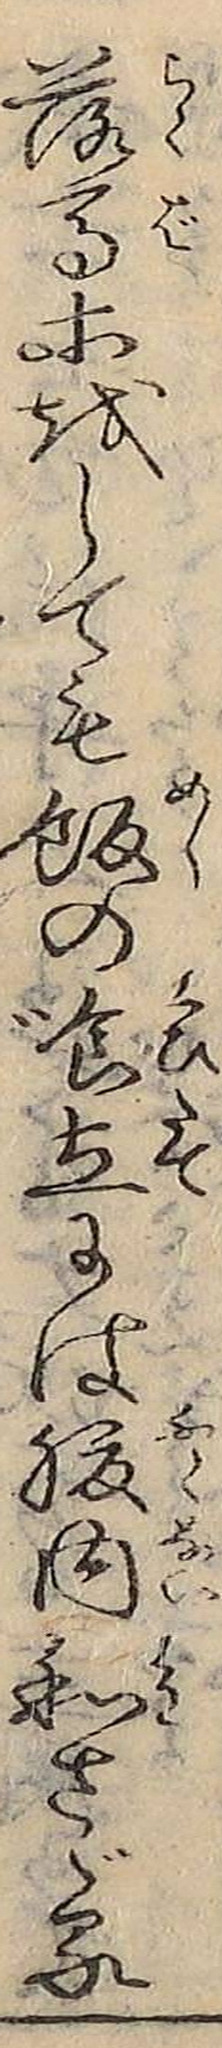落馬等をしても飯の喰立には腹内和さゞる
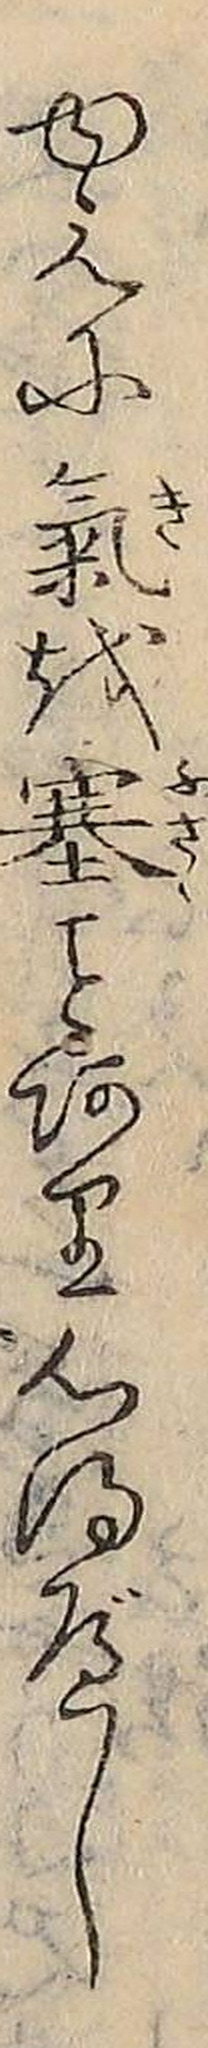ゆえに気を塞ことあり心得べし
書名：旅行用心集
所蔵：神戸大学附属図書館 国文学研究資料館
